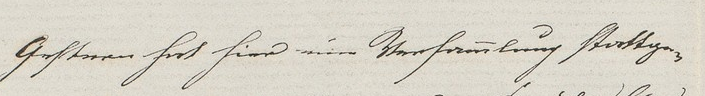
Gestern hat hier eine Versammlung stattge-
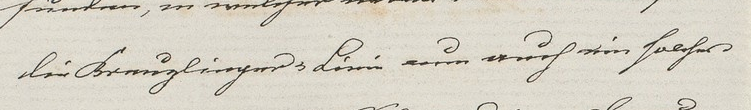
die Kreuzlinger-Linie nun auch ein solches
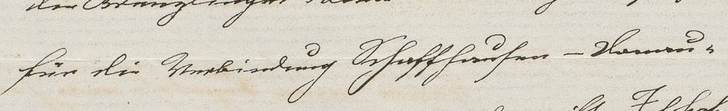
für die Verbindung Schaffhausen–Donau-
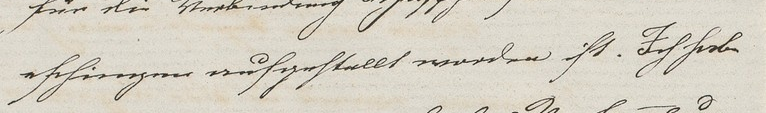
eschingen aufgestellt worden ist. Ich habe
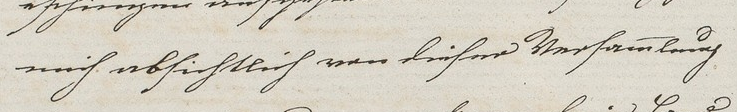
mich absichtlich von dieser Versammlung
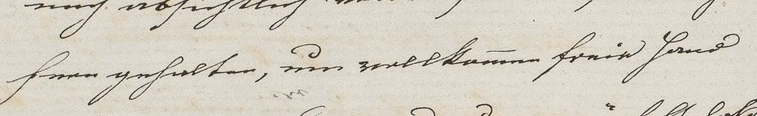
fern gehalten, um vollkommen freie Hand
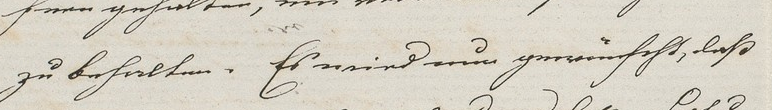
zu behalten. Es wird nun gewünscht, daß
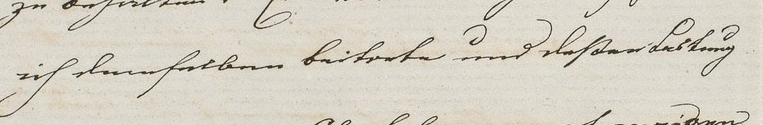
ich demselben beitrete und deßen Leitung
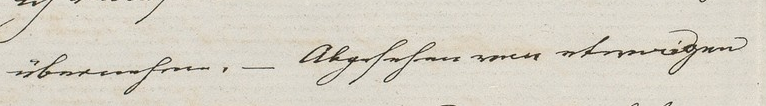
übernehme. – Abgesehen von etwaigen
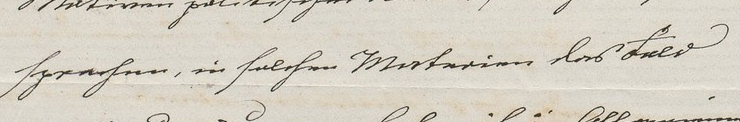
sprechen, in solchen Materien das Feld
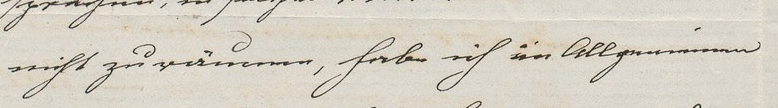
nicht zu räumen, habe ich im Allgemeinen
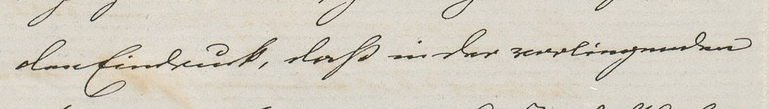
den Eindruck, daß in der vorliegenden
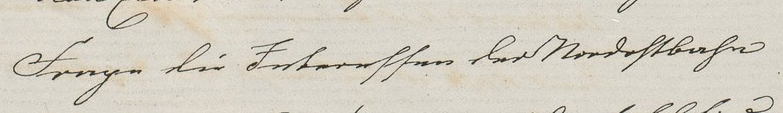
Frage die Interessen der Nordostbahn
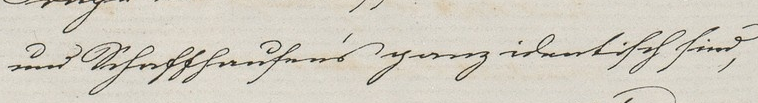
und Schaffhausen's ganz identisch sind,
